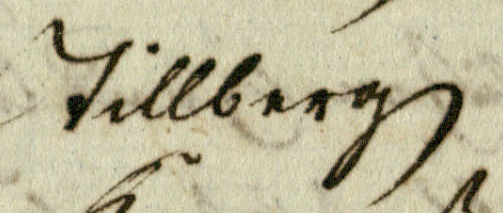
Tillberg
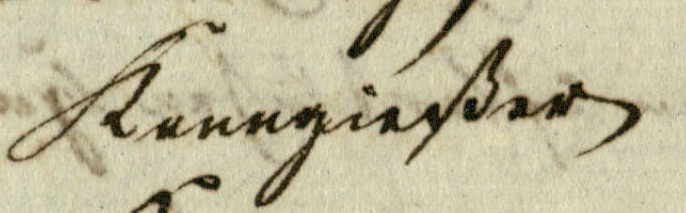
Kanngießer
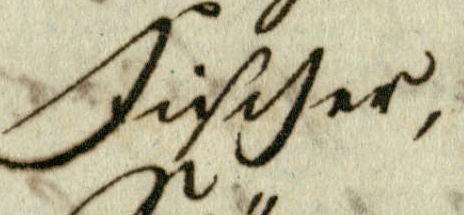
Fischer,
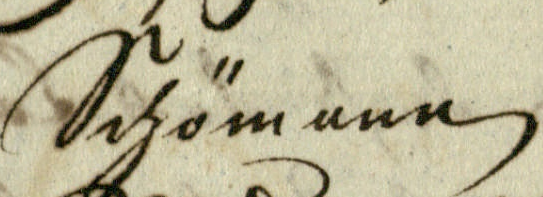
Schömann
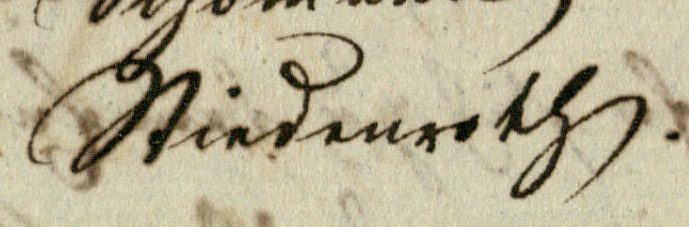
Stiedenroth.
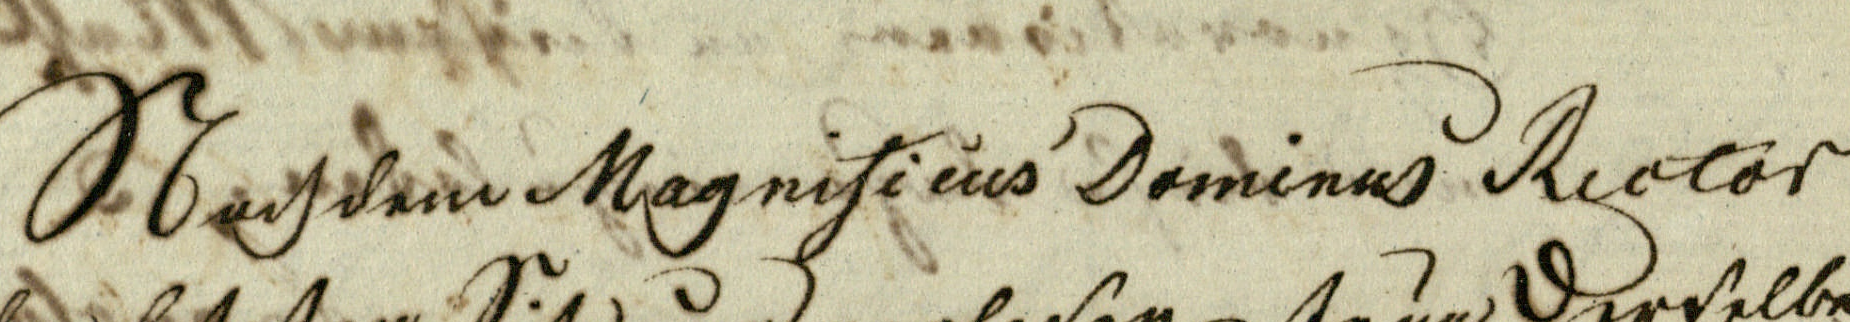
Nachdem Magnificus Dominus Rector
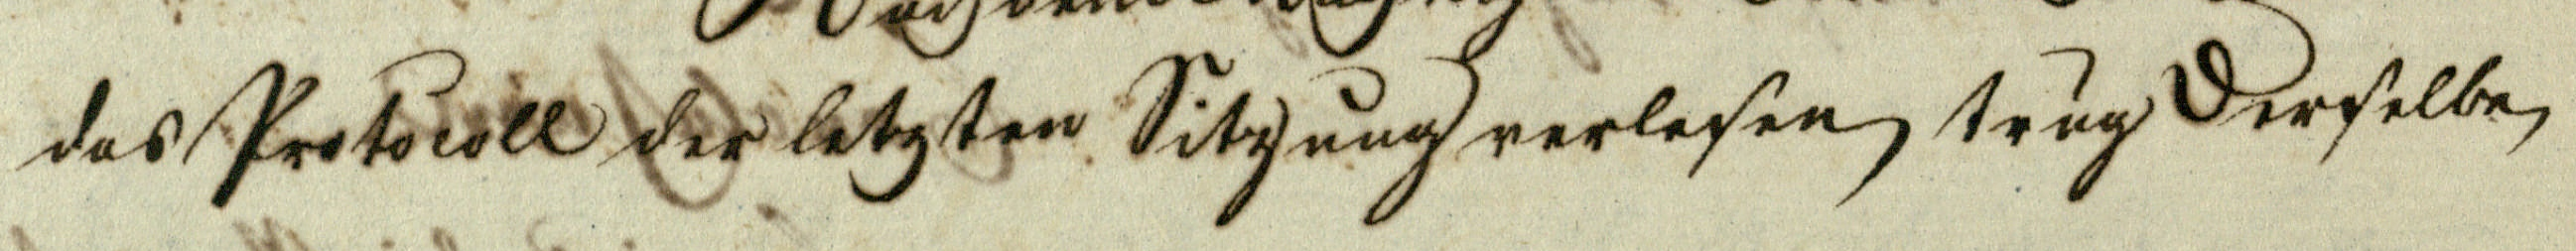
das Protocoll der letzten Sitzung verlesen trug Derselbe,
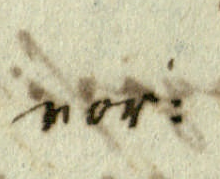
vor:
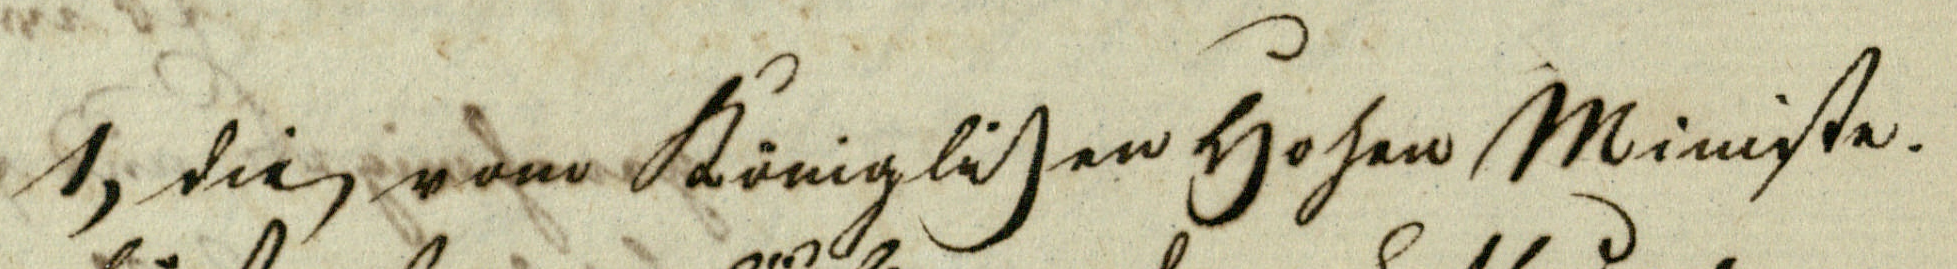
1, die vom Königlichen Hohen Ministe¬
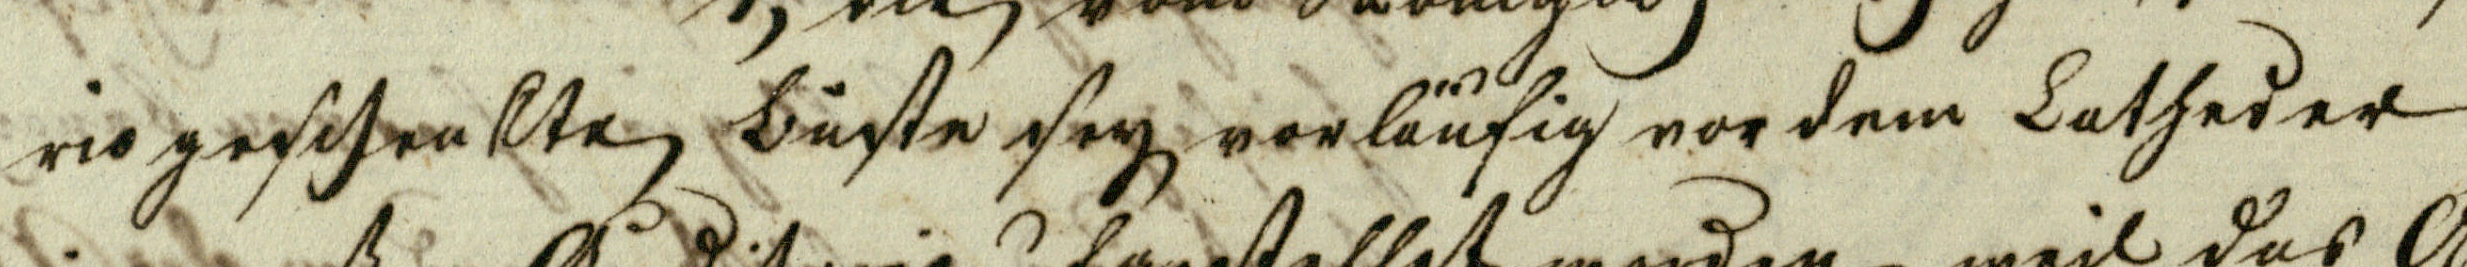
rio geschenkte Büste sey vorläufig vor dem Catheder
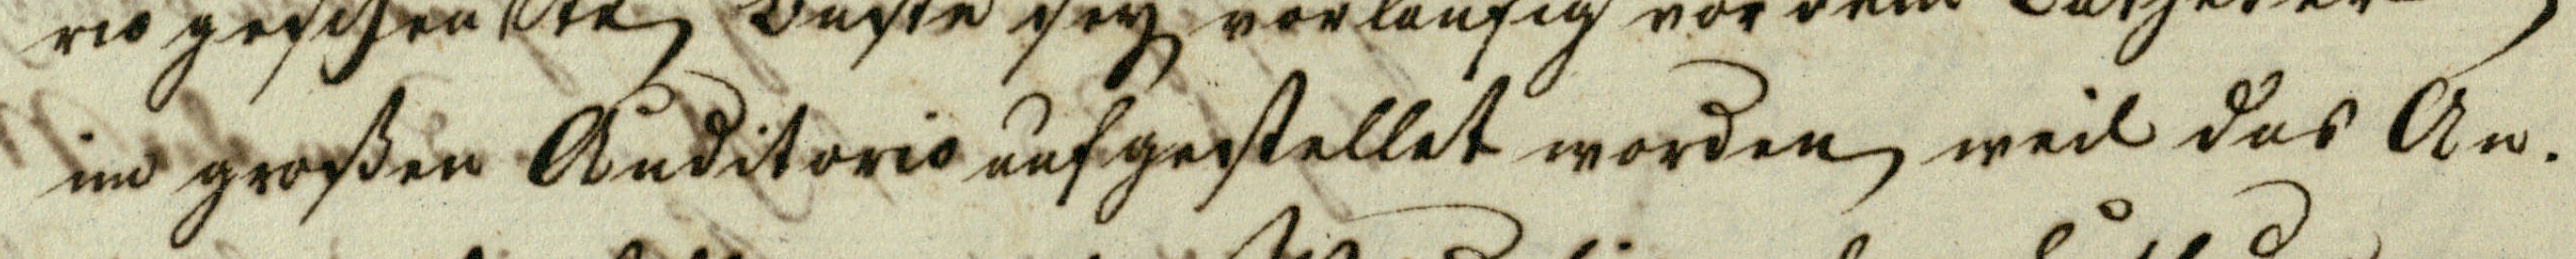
im großen Auditorio aufgestellet worden, weil das An¬
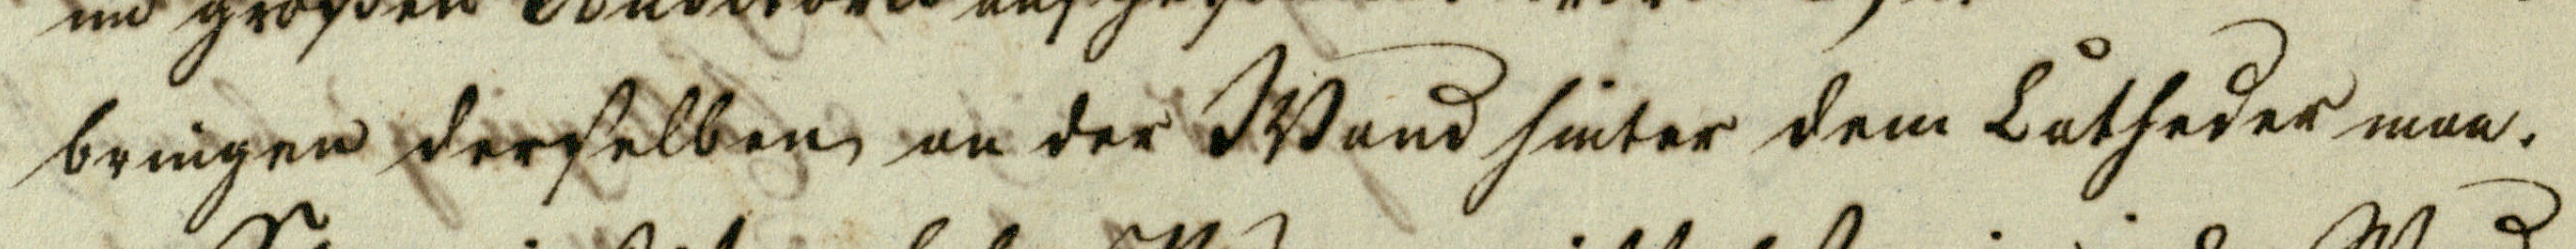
bringen derselben an der Wand hinter dem Catheder man¬
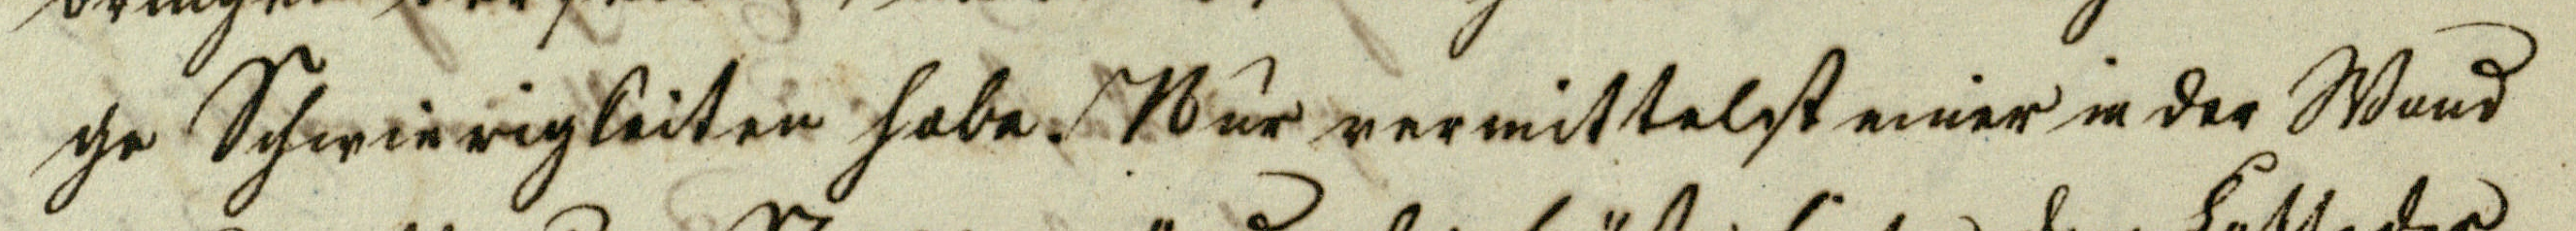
che Schwierigkeiten habe. Nus vermittelst einer in der Wand
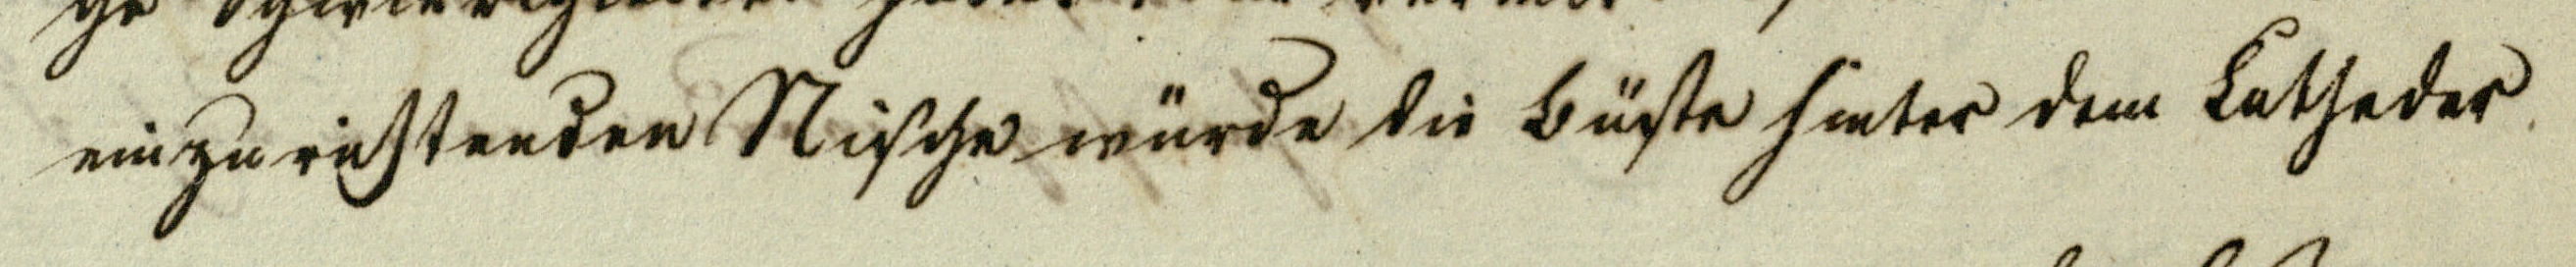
einzurichtenden Nische würde die Büste hinter dem Catheder
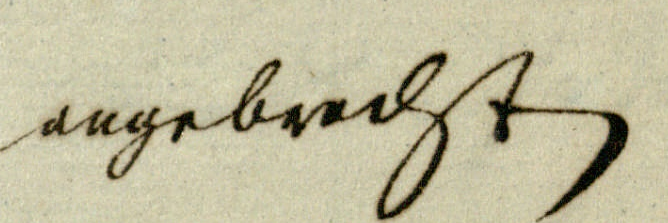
angebracht
